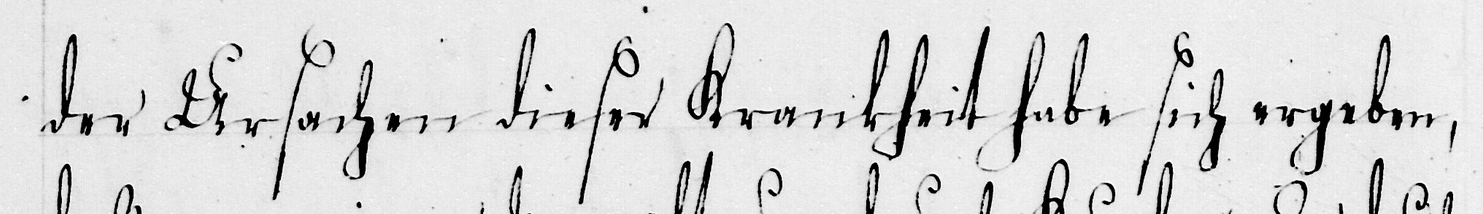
der Ursachen dieser Krankheit habe sich ergeben,
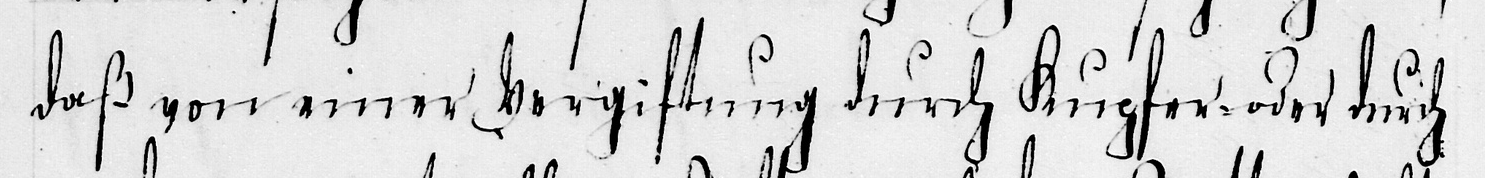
daß von einer Vergiftung durch Kupfer- oder durch
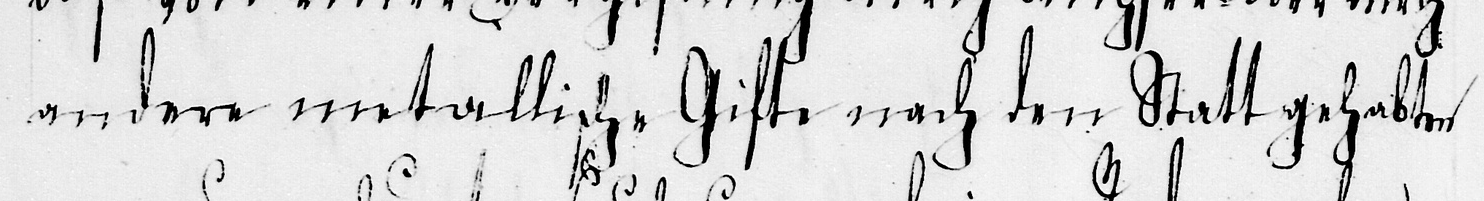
andere metallische Gifte nach den Statt gehabten
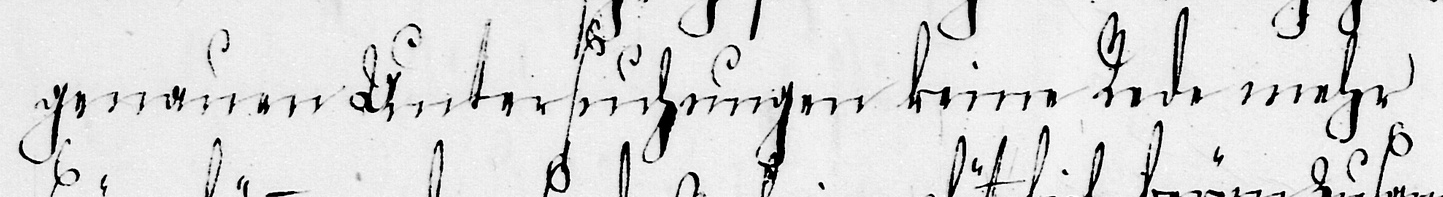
genauen Untersuchungen keine Rede mehr
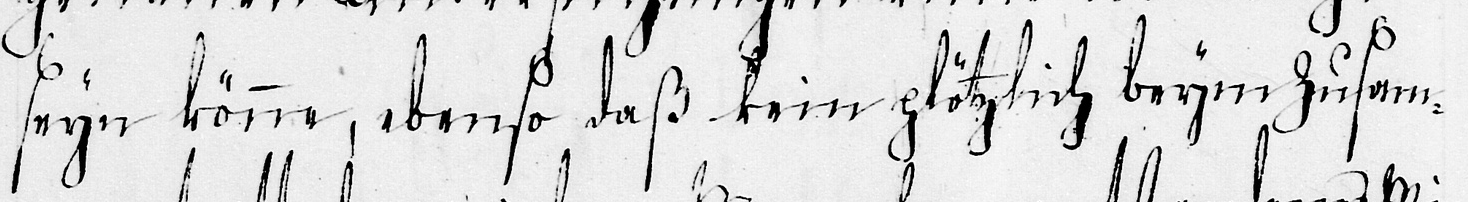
seyn könne, ebenso daß kein plötzlich beym Zusam¬
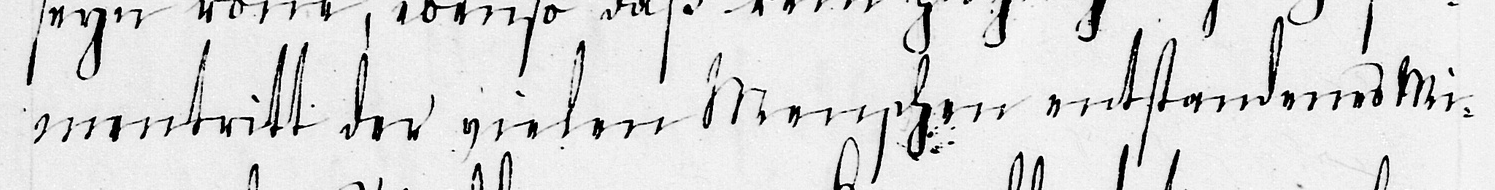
mentritt der vielen Menschen entstandenes Mi¬
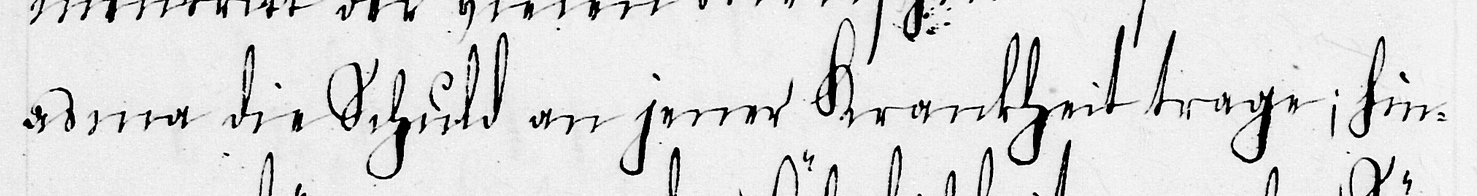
asma die Schuld an jener Krankheit trage; hin¬
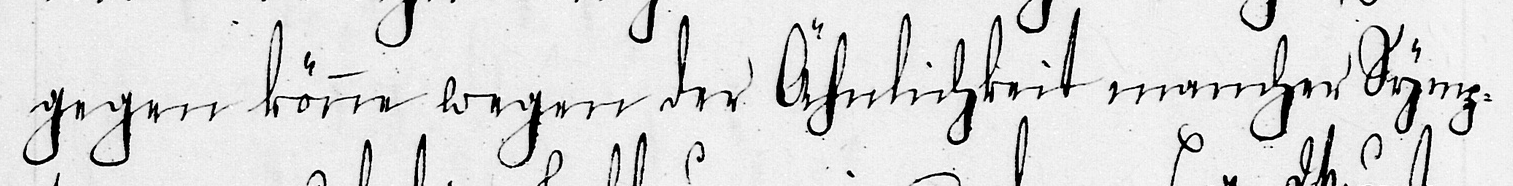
gegen könne wegen der Ähnlichkeit mancher Symp¬
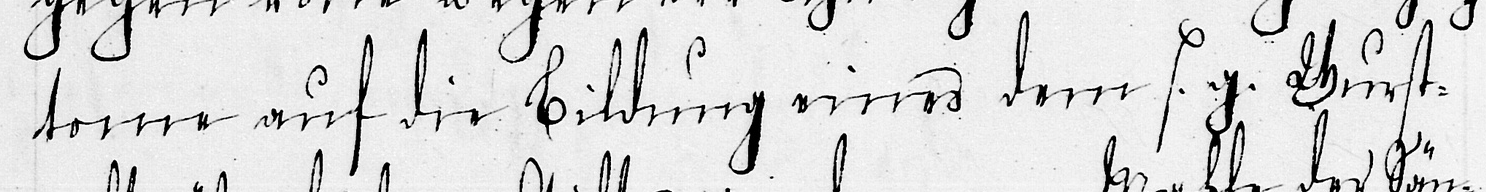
tome auf die Bildung eines dem s. g. Wurst¬
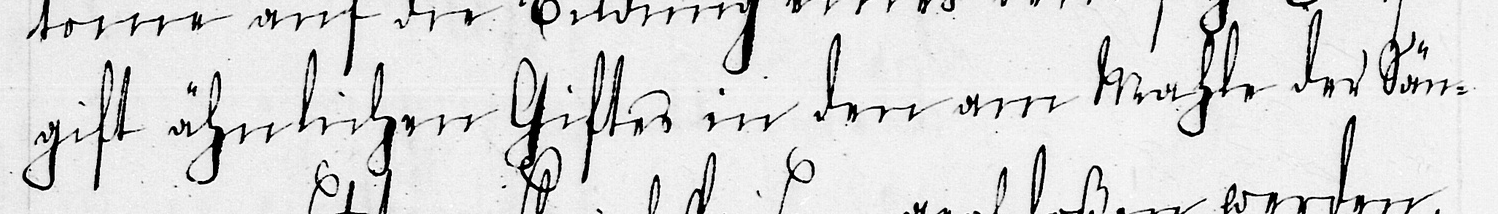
gift ähnlichen Giftes in den am Mahle der Sän¬
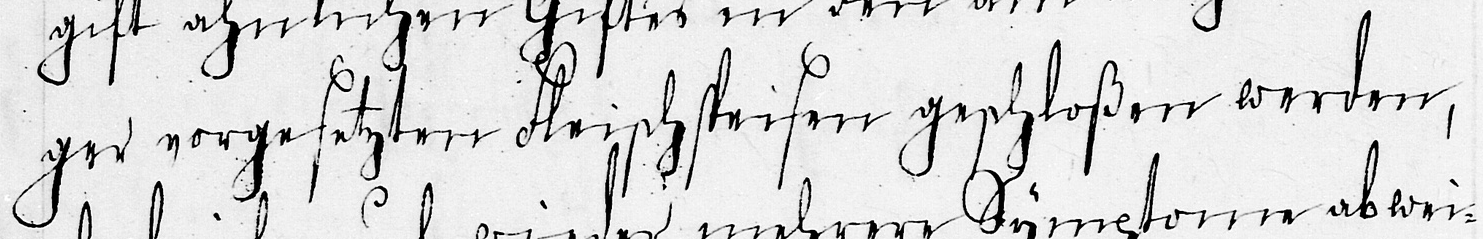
ger vorgesetzten Fleischspeisen geschloßen werden,
